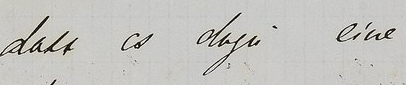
dass es dazu eine
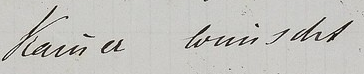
Kammer wünscht,
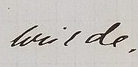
beides auf keinen
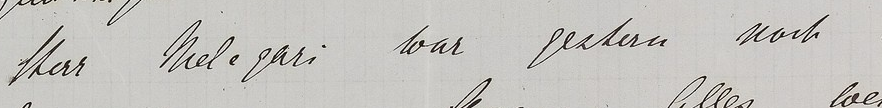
Herr Melegari war gestern noch
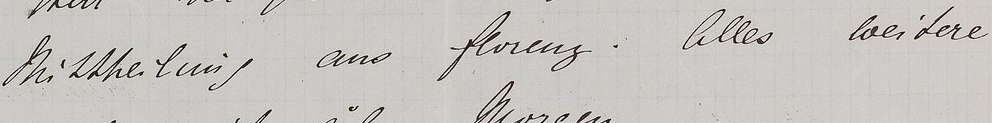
Mittheilung aus Florenz. Alles weitere
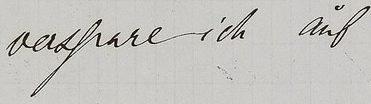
verspare ich auf
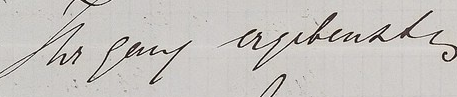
Ihr ganz ergebenster
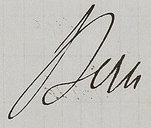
Welti
